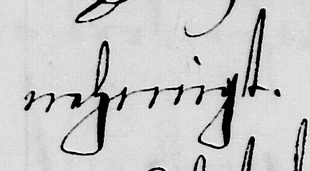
nehmigt.
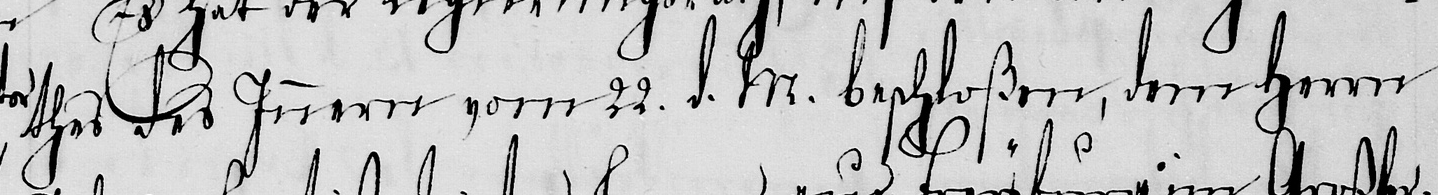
thes des Innern vom 22. d. M. beschloßen, dem Herrn
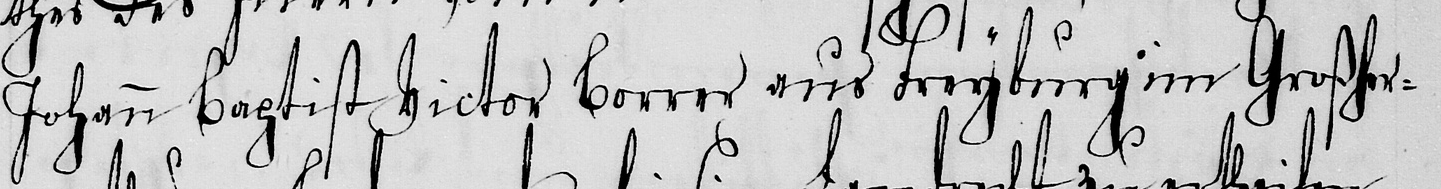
Johann Baptist Victor Borrer aus Freyburg im Großher¬
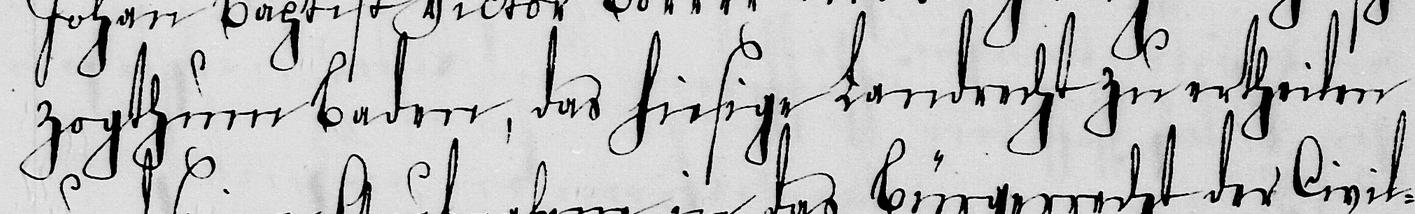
zogthum Baden, das hiesige Landrecht zu ertheilen
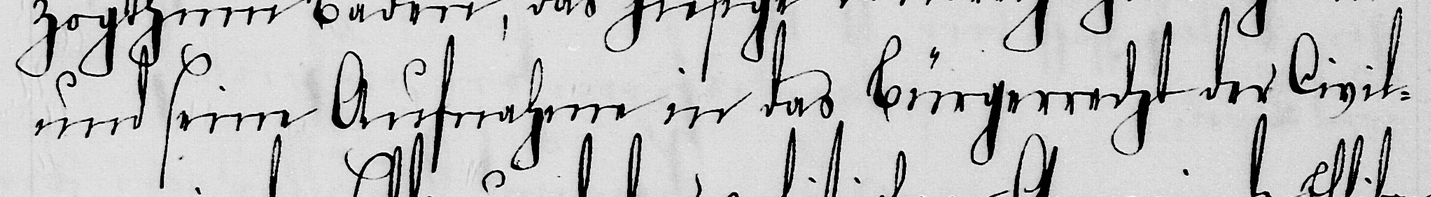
und seine Aufnahme in das Bürgerrecht der Civil¬
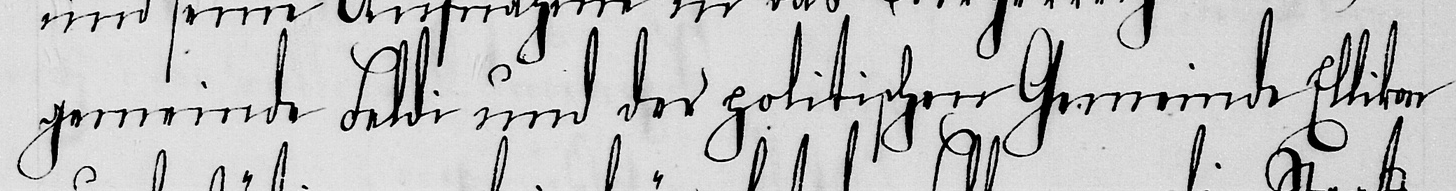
gemeinde Feldi und der politischen Gemeinde Elli¬
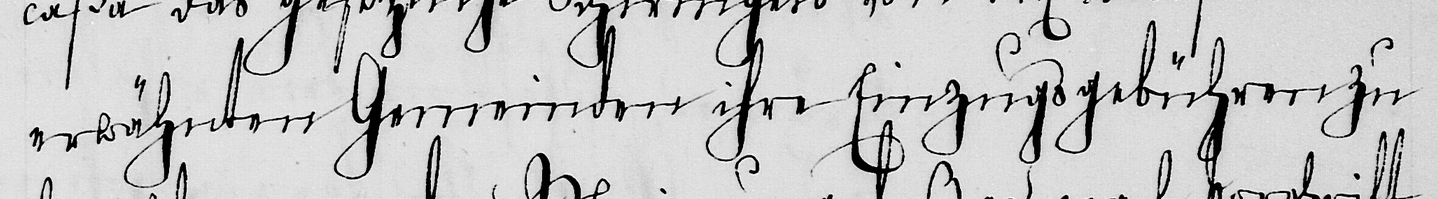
erwähnten Gemeinden ihre Einzugsgebühren zu
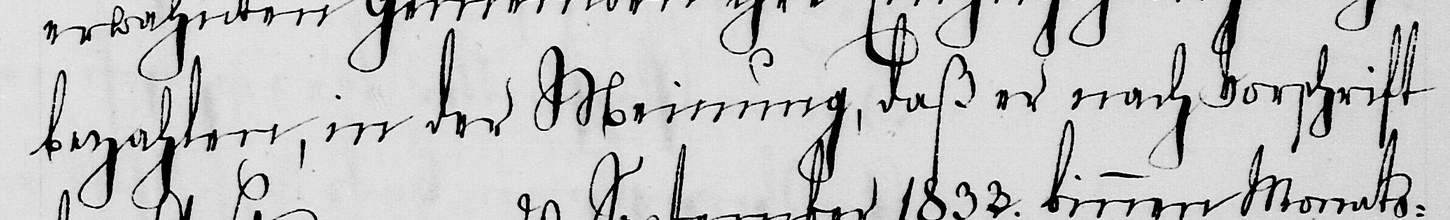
bezahlen, in der Meinung, daß er nach Vorschrift
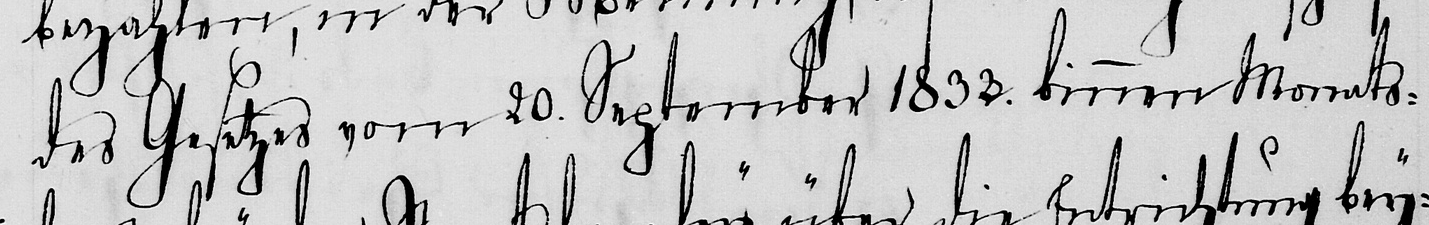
des Gesetzes vom 20. September 1832. binnen Monats¬
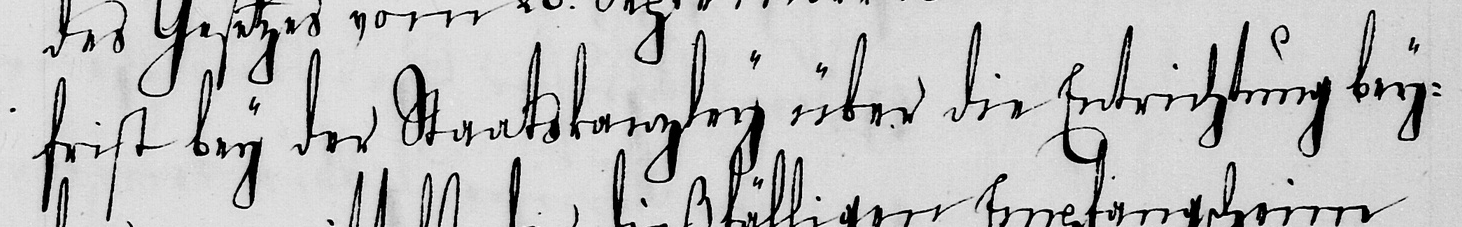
frist bey der Staatskanzley über die Entrichtung bey
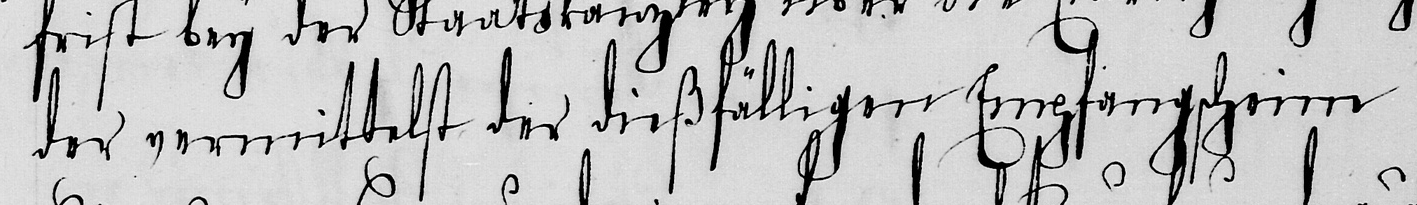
der vermittelst der dießfälligen Empfangscheine
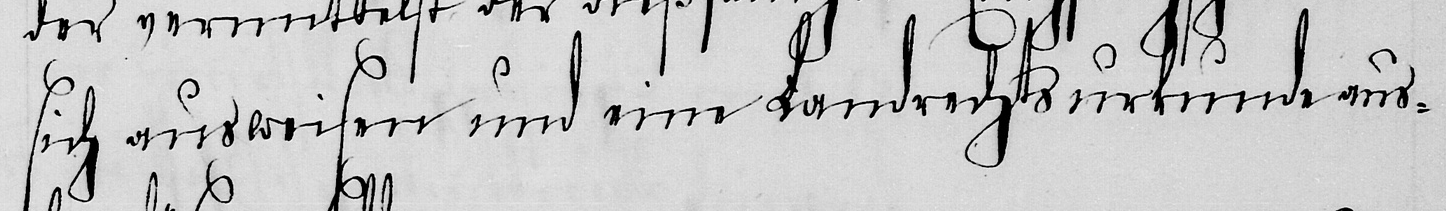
sich ausweisen und eine Landrechtsurkunde aus¬
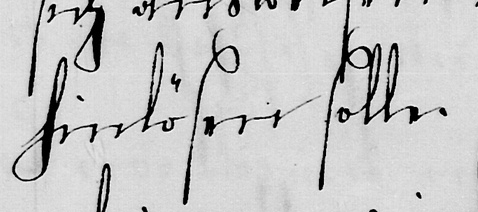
hinlösen solle.
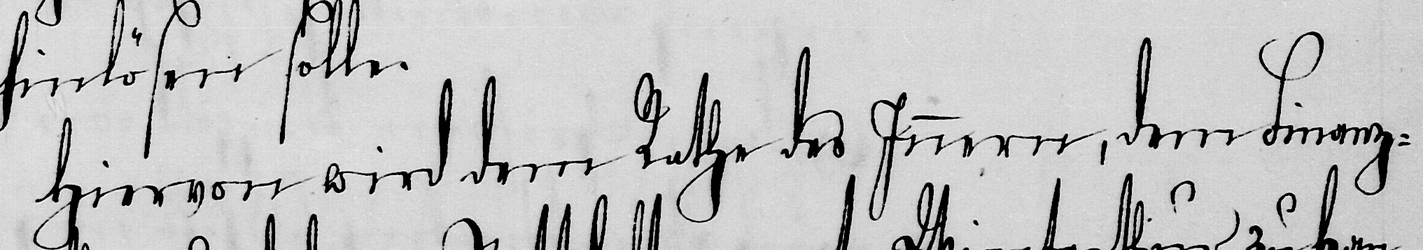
Hiervon wird dem Rathe des Innern, dem Finan¬
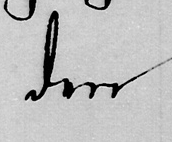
den
